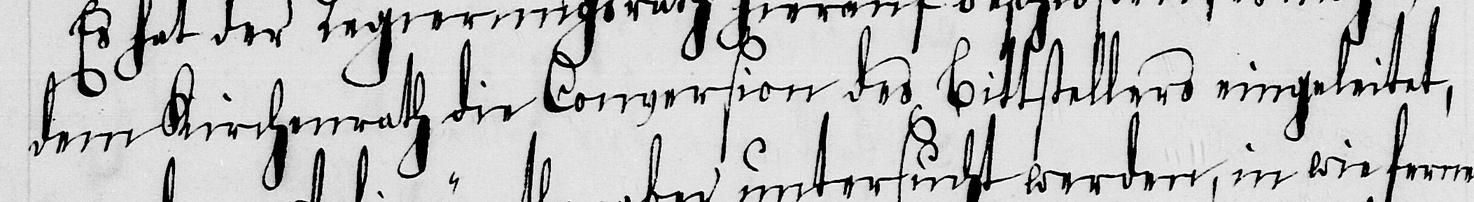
dem Kirchenrath die Conversion des Bittstellers eingeleitet,
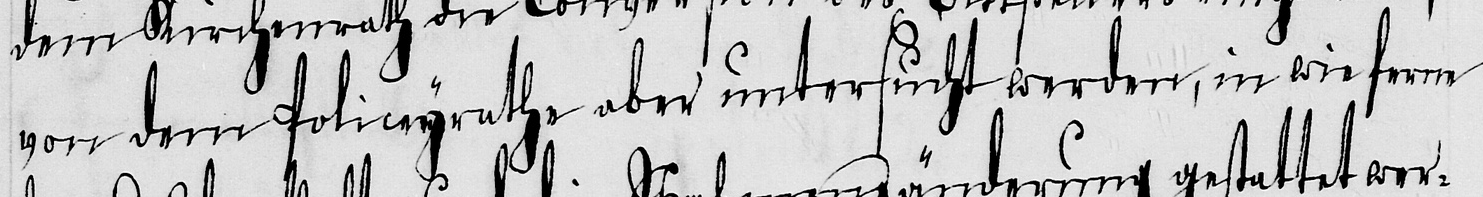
von dem Policeyrathe aber untersucht werden, in wie ferne
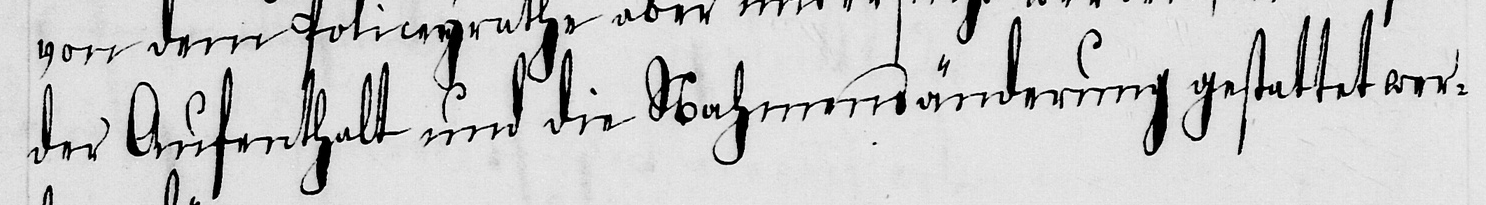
der Aufenthalt und die Nahmensänderung gestattet wer¬
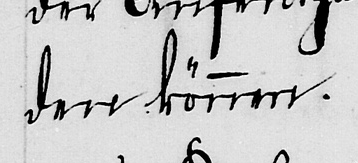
den können.
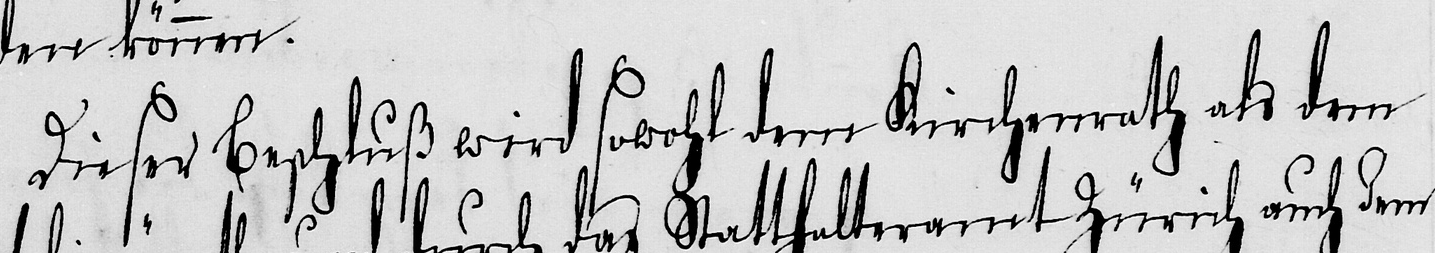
Dieser Beschluß wird sowohl dem Kirchenrath als dem
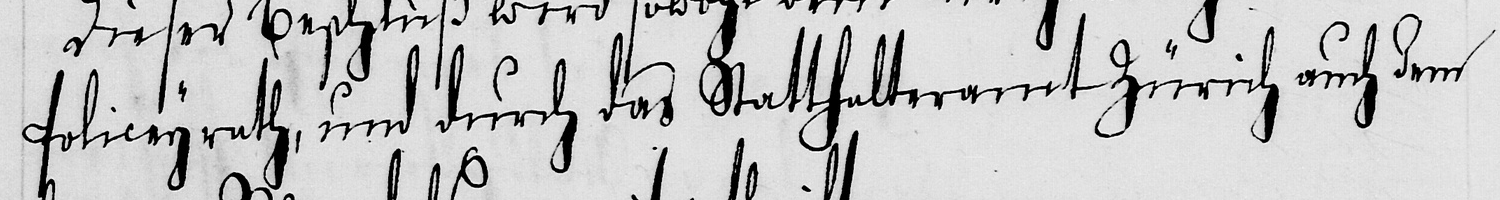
Policeyrath, und durch das Statthalteramt Zürich hauch dem
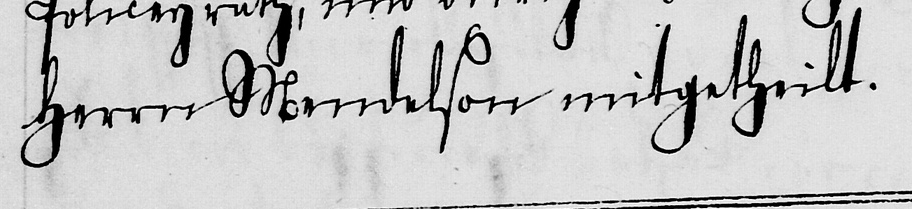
Herrn Mendelson mitgeteilt.
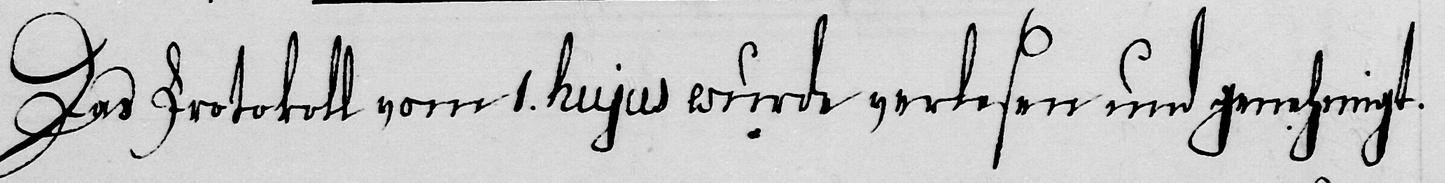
Das Protokoll vom 1. hujus wurde verlesen und genehmigt.
